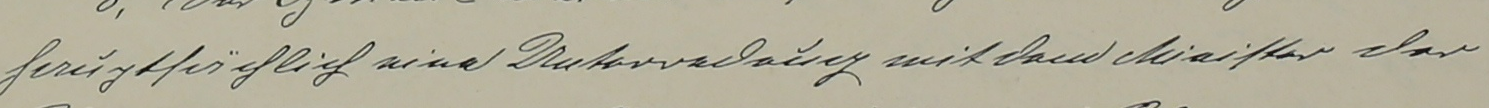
hauptsächlich eine Unterredung mit dem Minister der
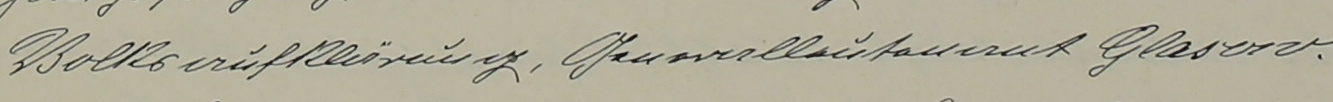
Volksaufklärung, Generalleutenant Glasow.
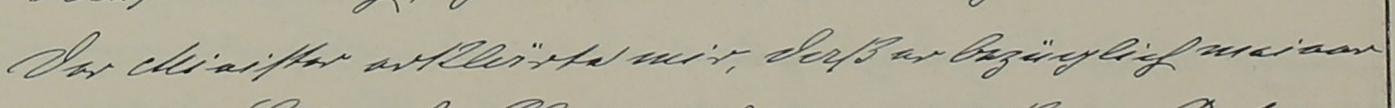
Der Minister erklärte mir, daß er bezüglich meiner
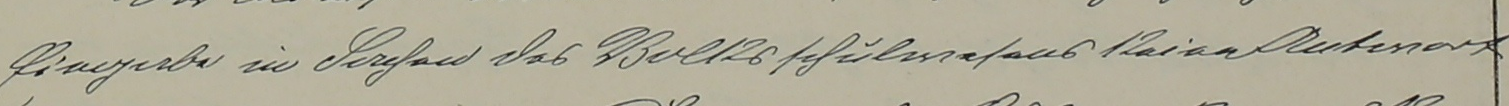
Eingabe in Sachen des Volksschulwesens keine Antwort
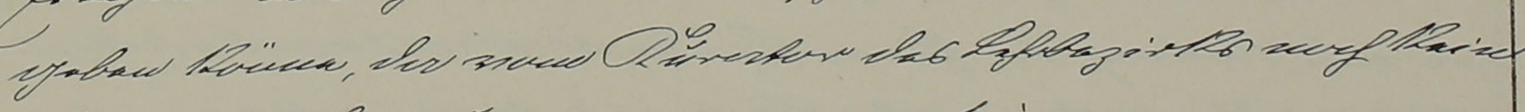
geben könne, da vom Kurator des Lehrbezirks noch kein
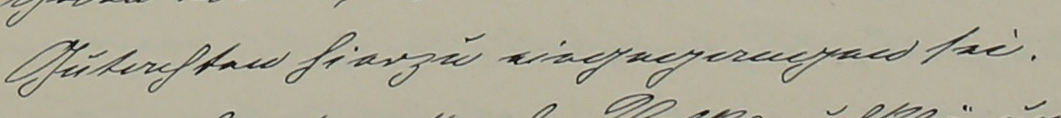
Gutachten eingegangen sei.
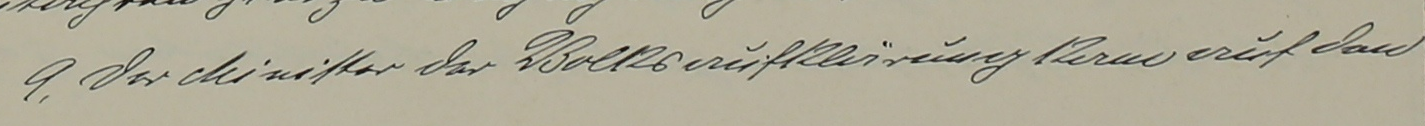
9. Der Minister der Volksaufklärung kam auf den
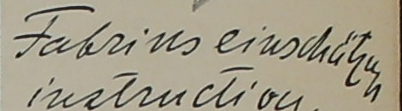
Fabrikeinschätzungs
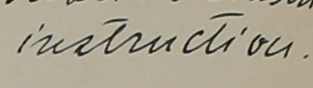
instruction
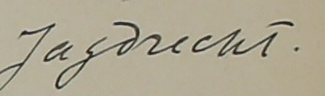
Jagdrecht.
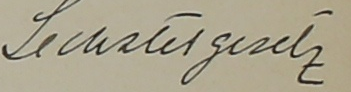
Sechstelgesetz.
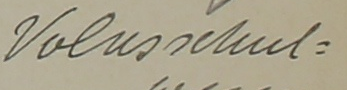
Volksschul-
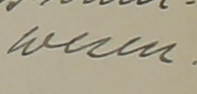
wesen
